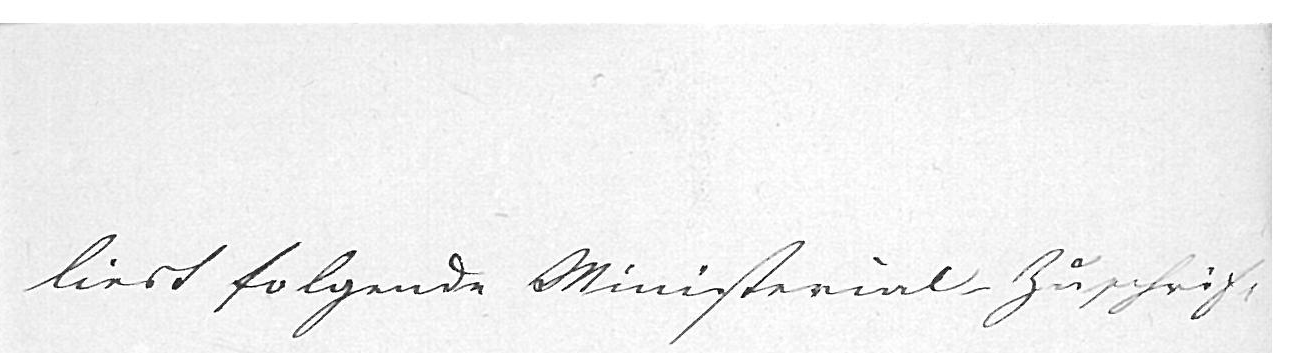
liest folgende Ministerial-Zuschrif-
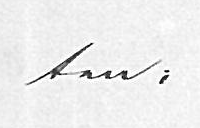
ten:
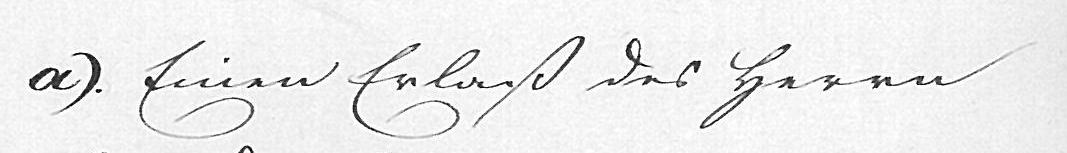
a) Einen Erlaß des Herrn
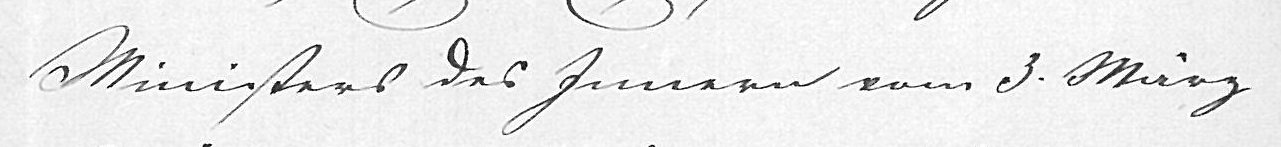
Ministers des Innern vom 3. März
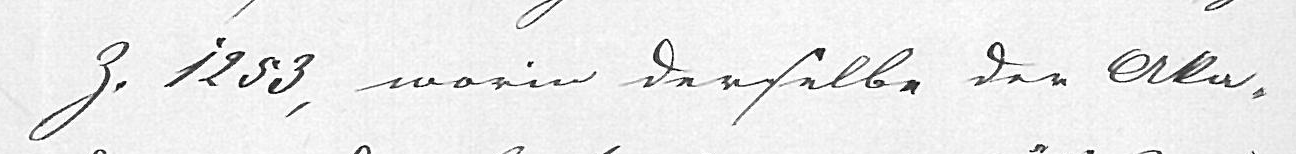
Z. 1253, worin derselbe der Aka-
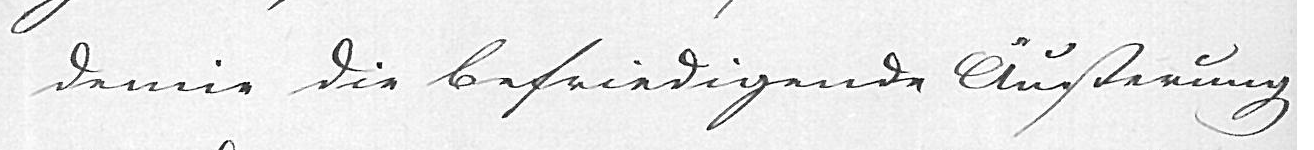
demie die befriedigende Äußerung
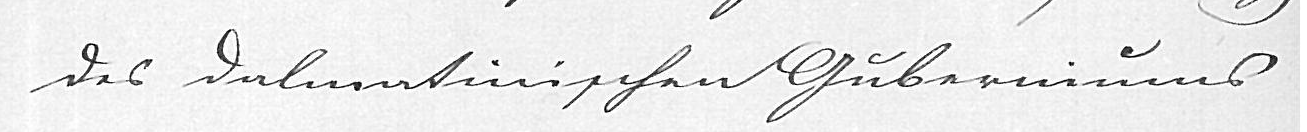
des dalmatinischen Guberiums
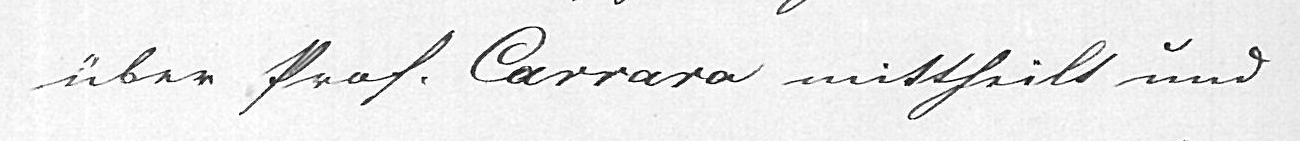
über Prof. Carrara mittheilt und
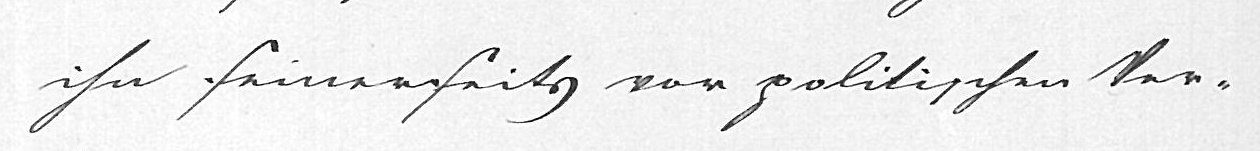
ihn seinerseits vor politischen Ver-
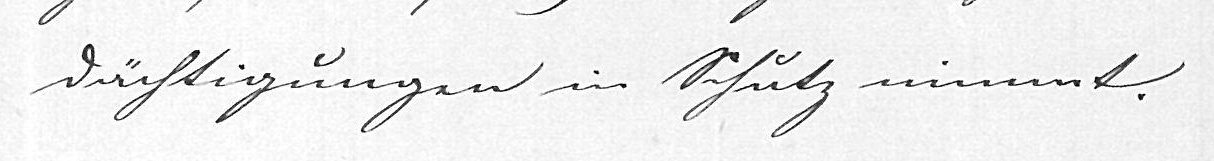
dächtigungen in Schutz nimmt.
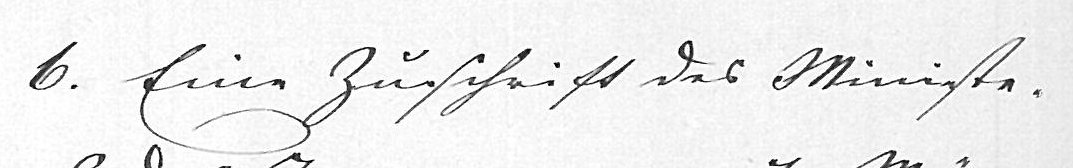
b. Eine Zuschrift des Ministe-
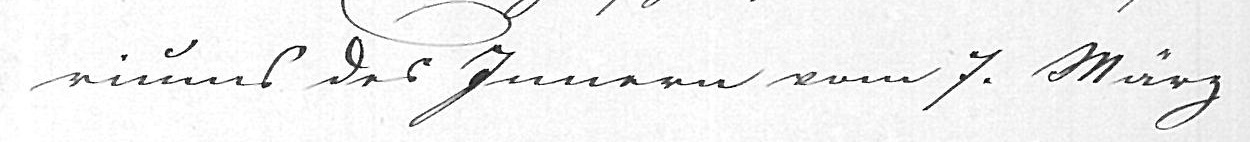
riums des Innern vom 7. März
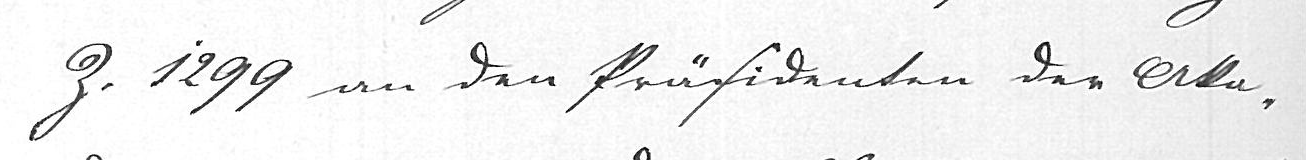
Z. 1299 an den Präsidenten der Aka-
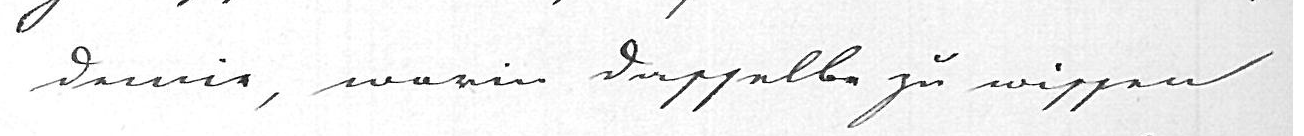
demie, worin dasselbe zu wissen
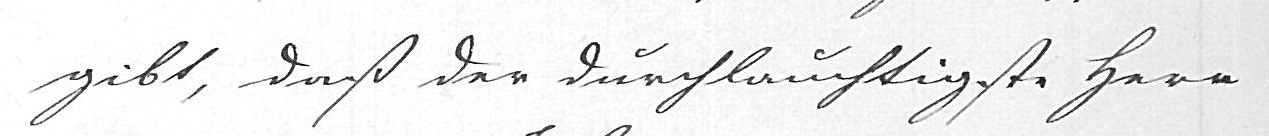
gibt, daß der durchlauchtigste Herr
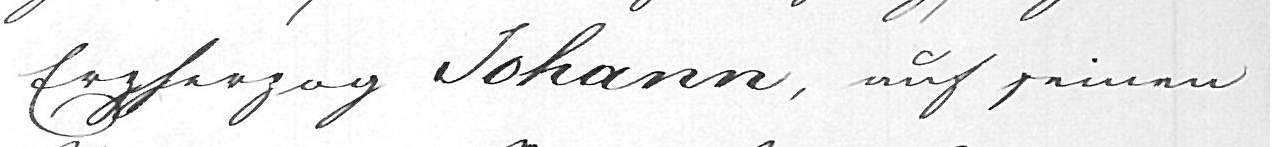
Erzherzog Johann, auf seinen
